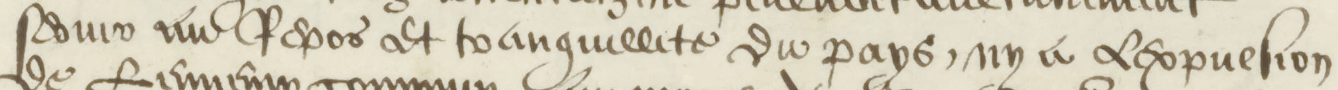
servir au Repos et tranquillite du pays, ny a lexpulsion
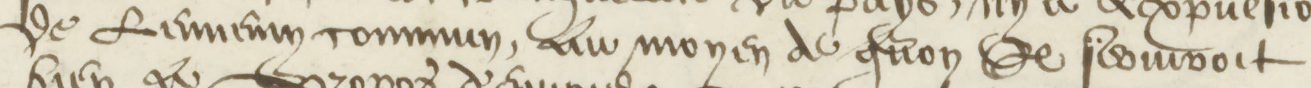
de lennemy commun, au moyen de quoy il seruiroit
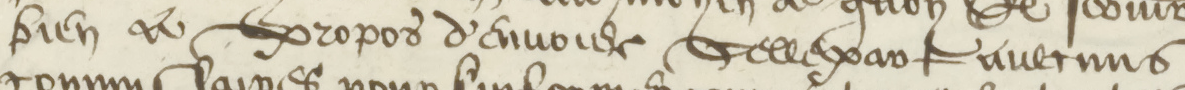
bien a Propos d'enuoier Celle part aulcuns
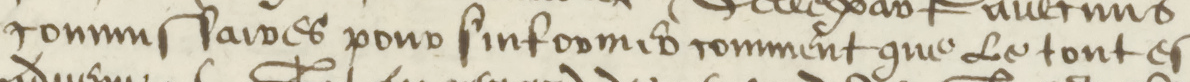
commissaires pour s‛informer comment que le tout est
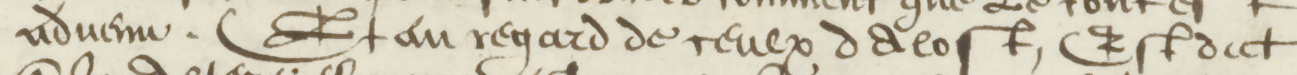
aduenu. Et au regard de ceulx dAlost, Est dict
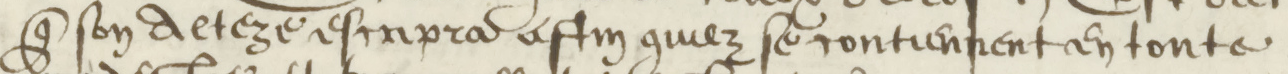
ca. son Aleze escripra affin quilz se contiennent en toute
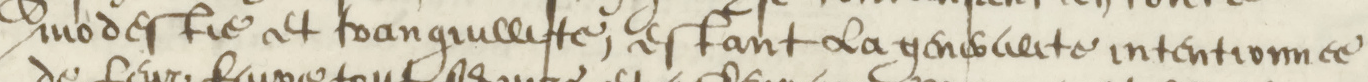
modestie et tranquillite, estant la generalite intentionnee
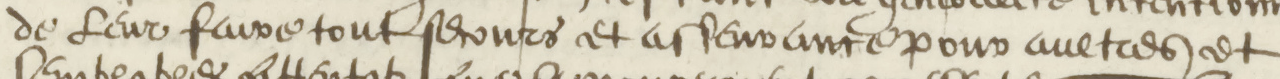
de leur faire tout secours et asseurance pour aultres et
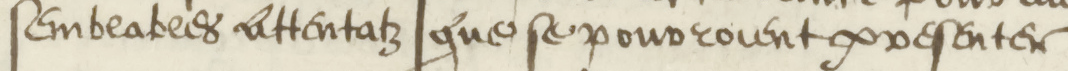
semblables attentatz que se pourroient presenter
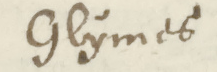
Glijmes
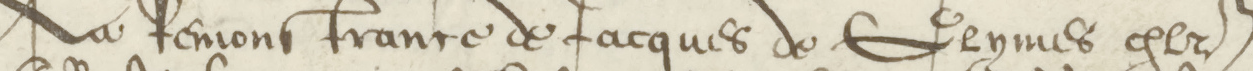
La Remonstrance de Jacques de Glymes chlr
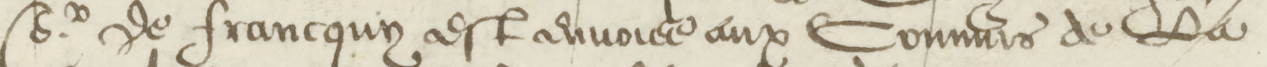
Sr. de Francquy est enuoiee aux Commis de la
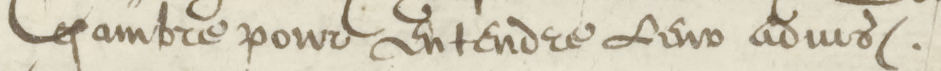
chambre pour entendre leur aduis
